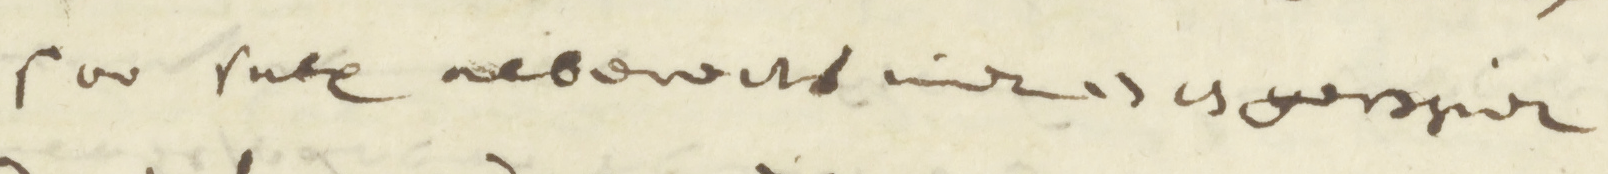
soo sulx albereits niet en is geschiet
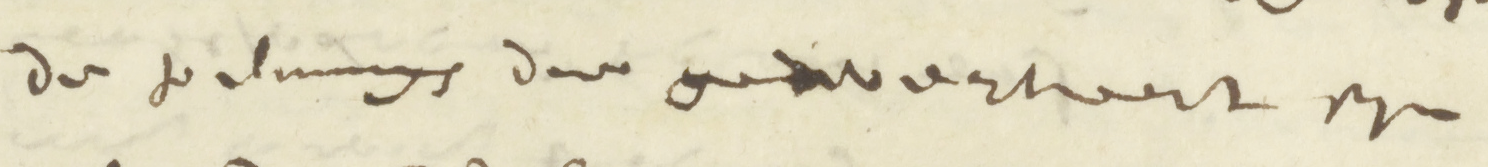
de penningen die gediverteert syn
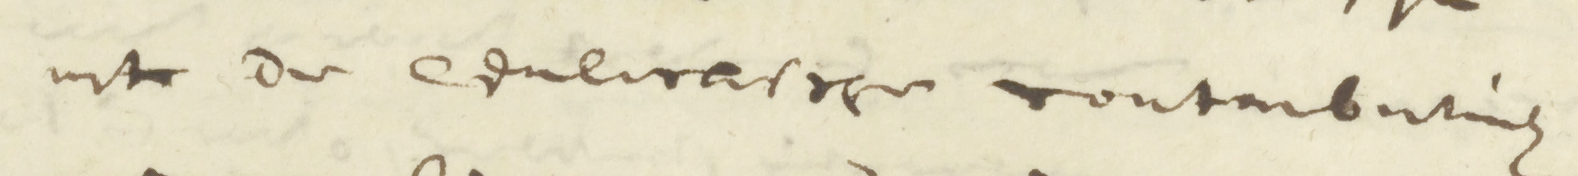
uyt de Gulicksche contributien
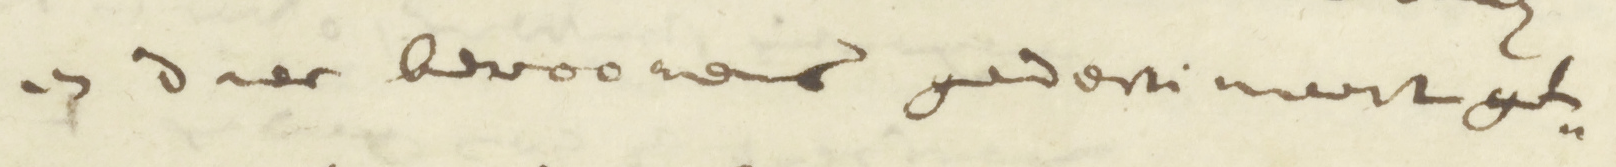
en daer bevoorens gedestineert ge„
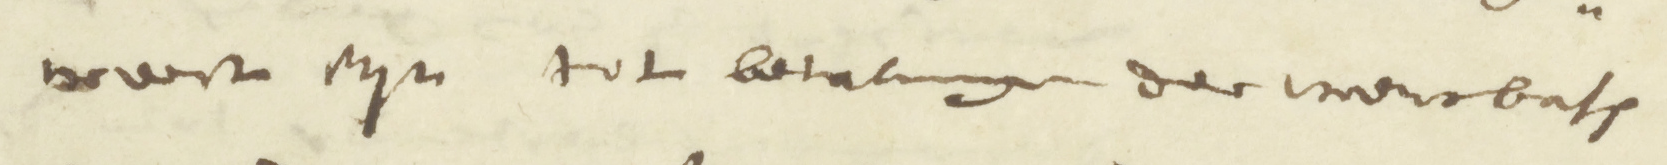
weest syn tot betalinge der wercbasen
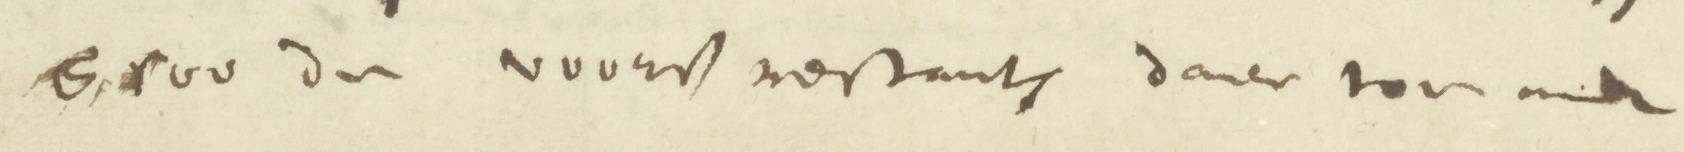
& soo de voors restanten daer toe niet
